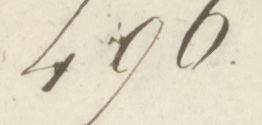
496.
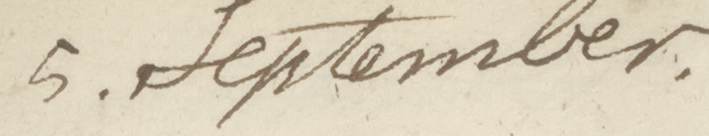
5. September.
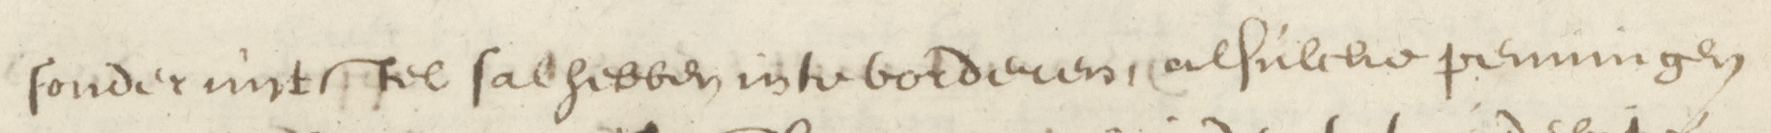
sonder uytstel sal hebben in te vorderen, alsulcke penningen
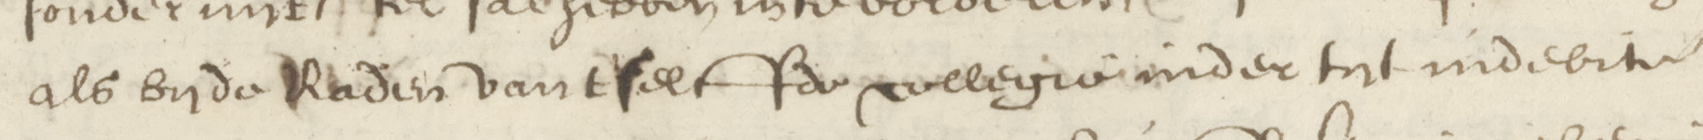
als byde Raden van t‛selffde collegie inder tyt indebite
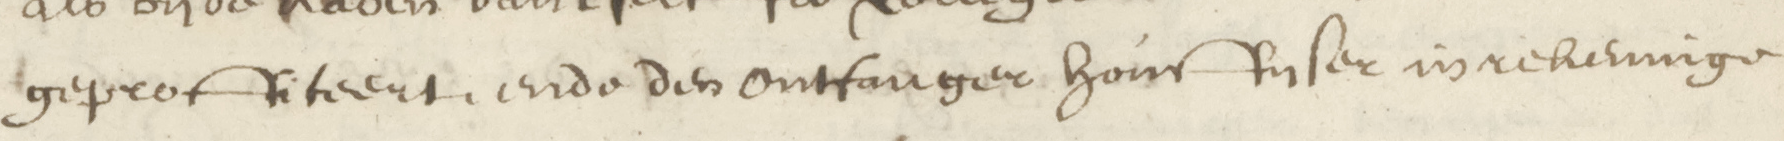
geproffiteert, ende den ontfanger houffyser in rekeninge
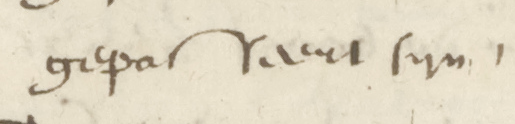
gepasseert syn.
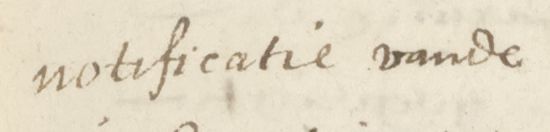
notificatie vande
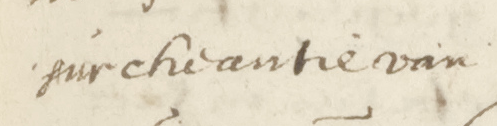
surcheantie van
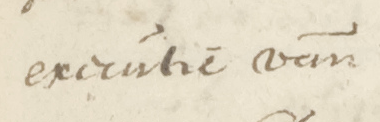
executie van
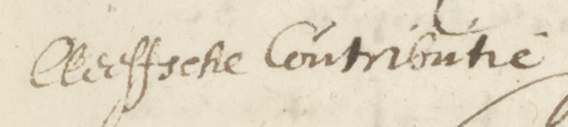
Cleeffsche Contributie
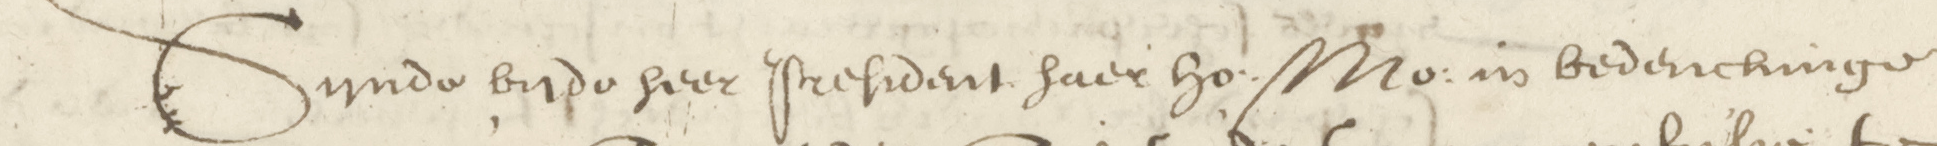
Synde byde heer President haer ho:Mo: in bedenckinge
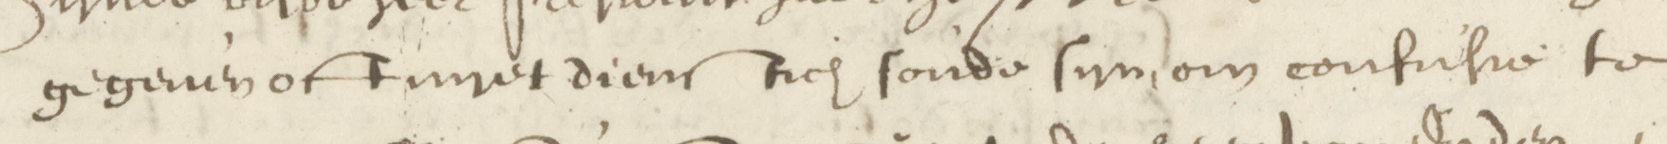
gegeuen off nyet dienstich soude syn, om confusie te
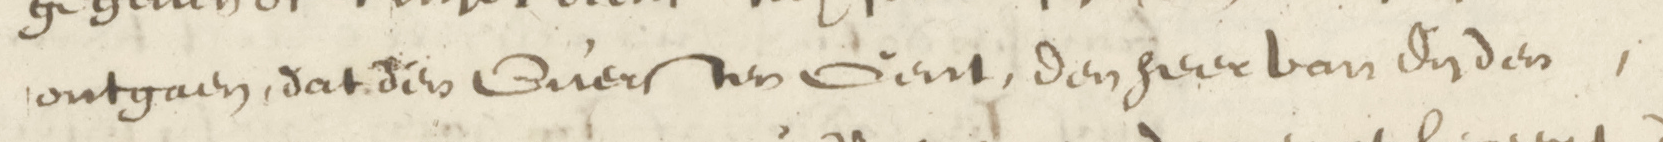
ontgaen, dat den Ouersten Gent, den heer van Dijden,
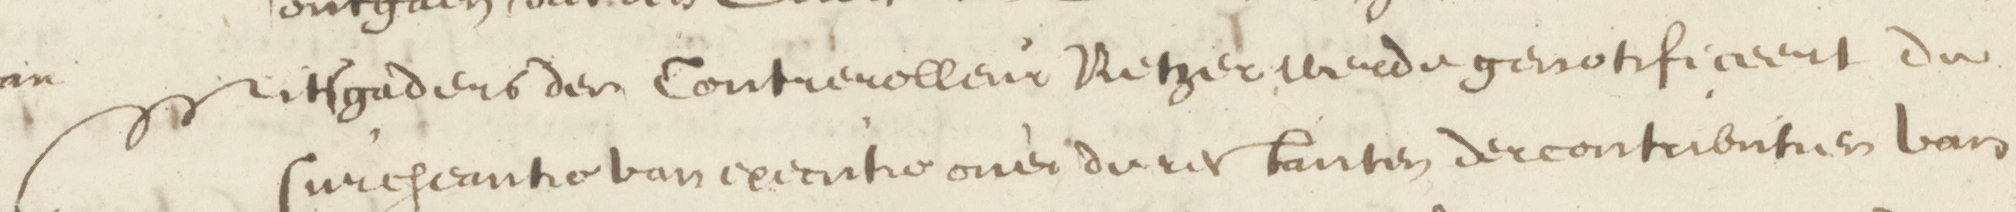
Mitsgaders den Contrerolleur Retzer werde genotificeert de
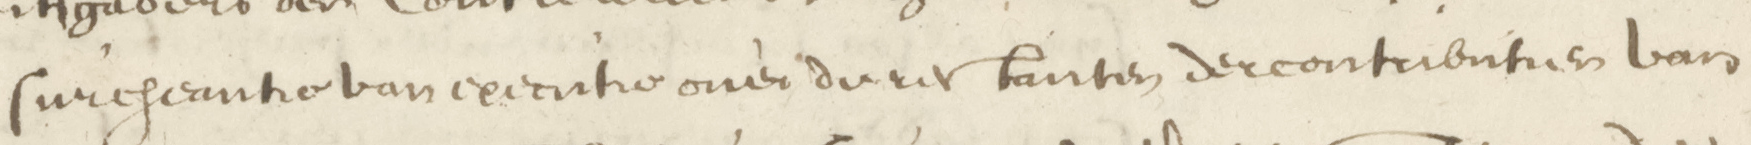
surcheantie van executie ouer de restanten der contributien van
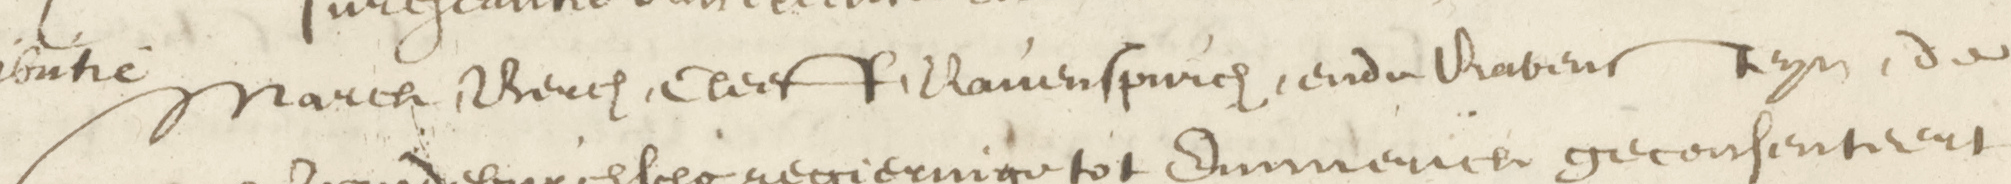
Marck Berch, Cleeff, Rauenspurch ende Ravensteyn, de
